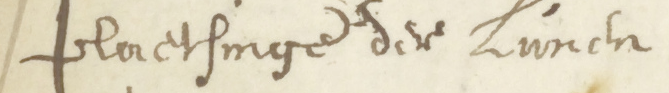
plaetsinge der Lunen
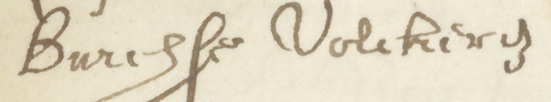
Burchse Volckeren
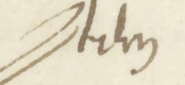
item
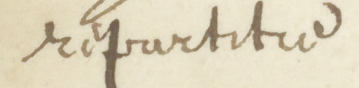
repartitie
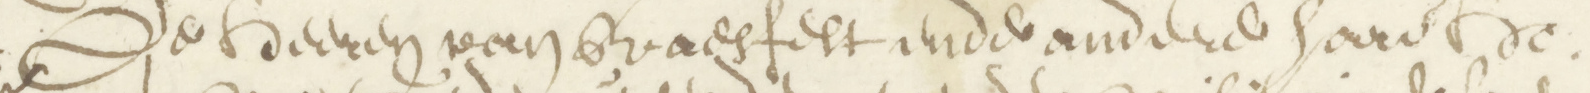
De Heeren van Raesfelt ende andere hare Ho:
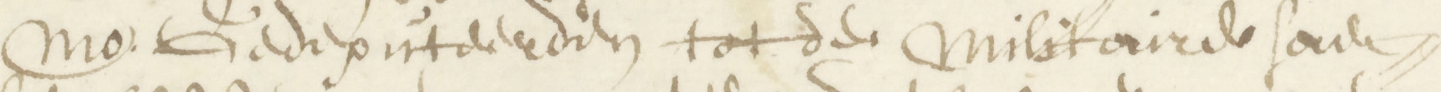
Mo: Gedeputeerden tot de Militaire saec,,
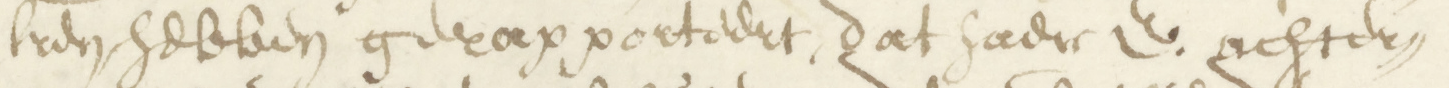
ken, hebben gerapporteert, dat haer E. achter„
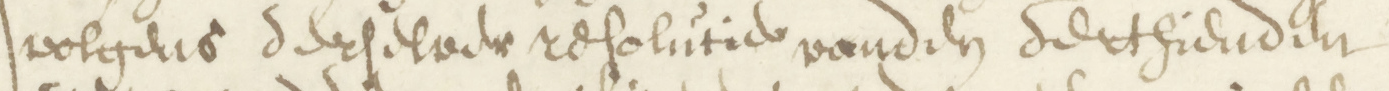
volgens derselver resolutie vanden derthienden
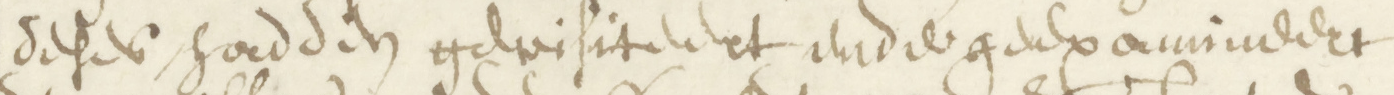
deses, hadden gevisiteert ende geexamineert
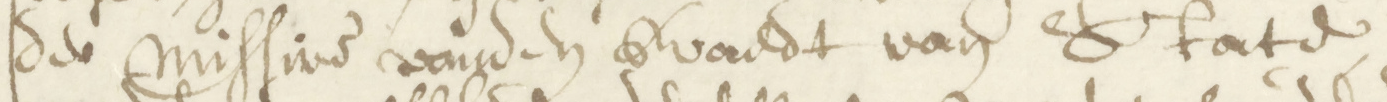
de missive vanden Raedt van State
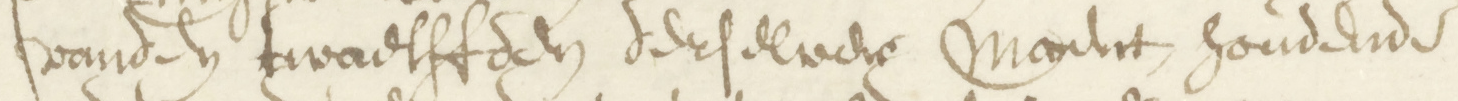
vanden twaelffden derselver maent, houdende
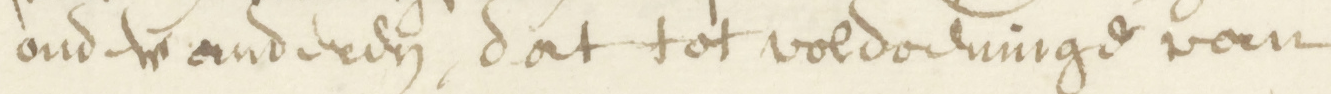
onder anderen, dat tot voldoeninge van
